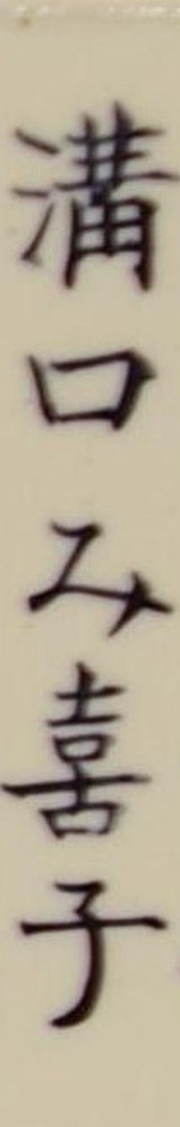溝口み喜子
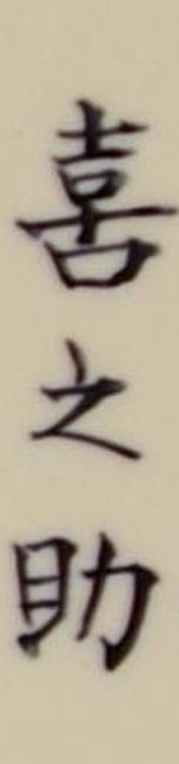喜之助
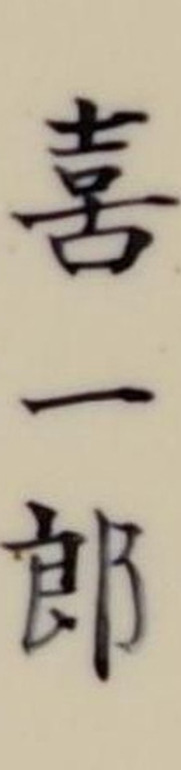喜一郎
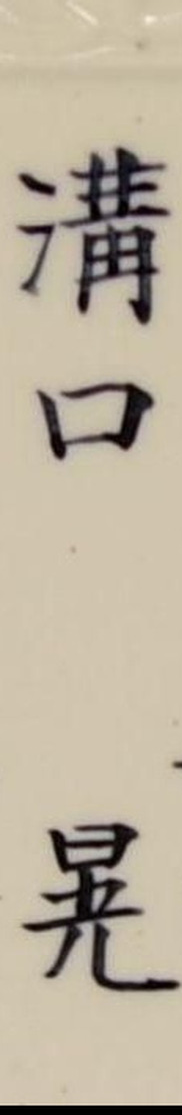溝口晃
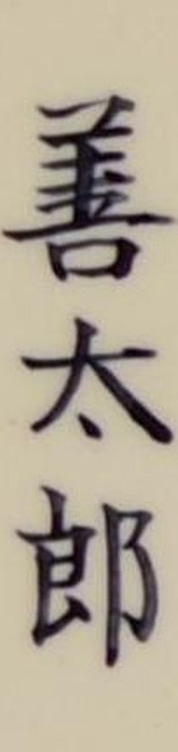善太郎
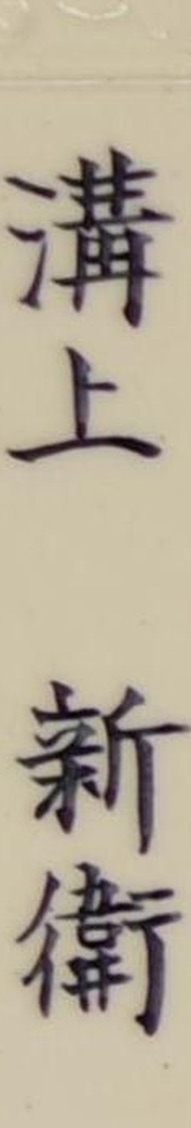溝上新衛
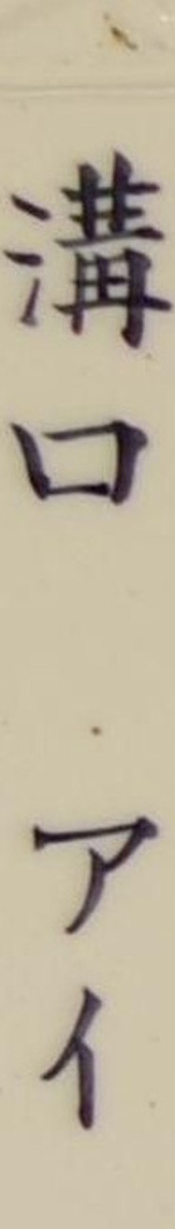溝口アイ
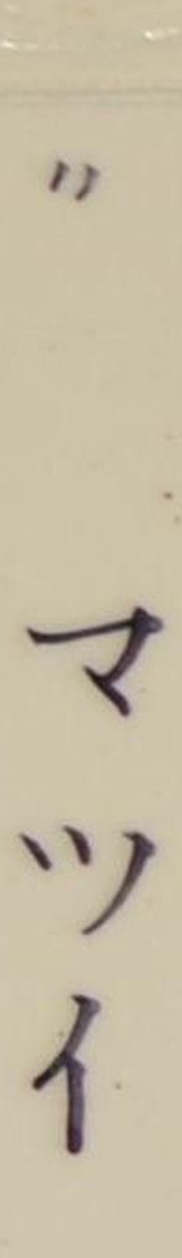マツイ
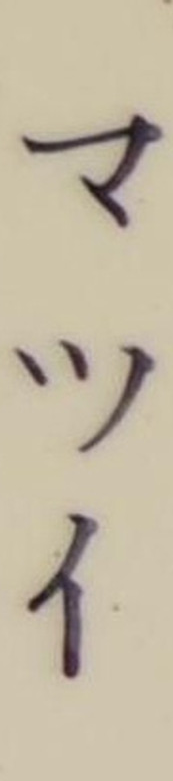マツイ
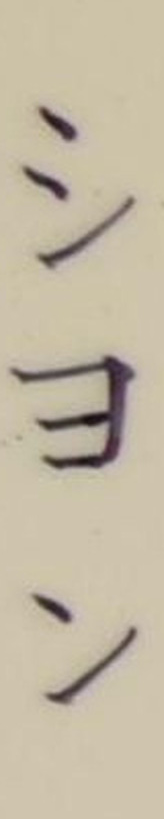シヨン
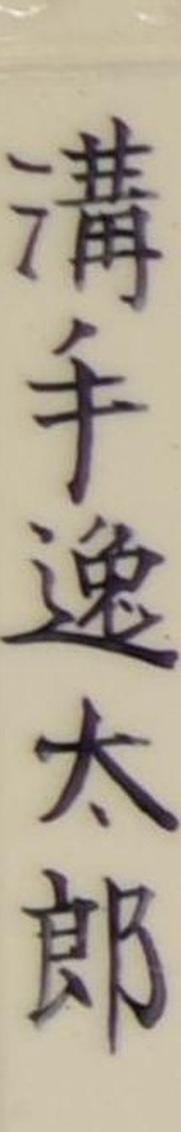溝手逸太郎

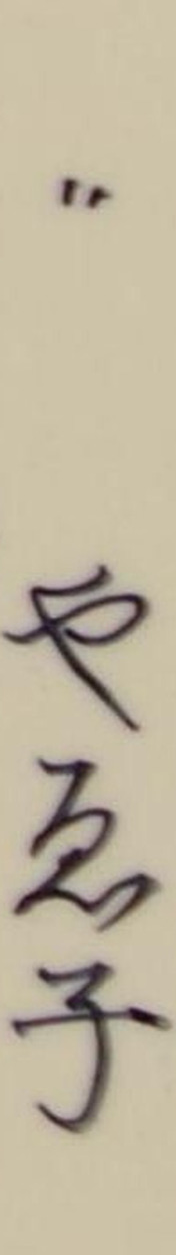やゑ子
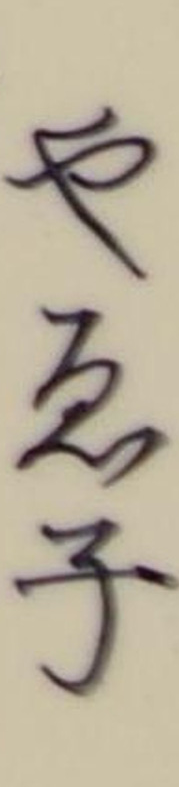やゑ子
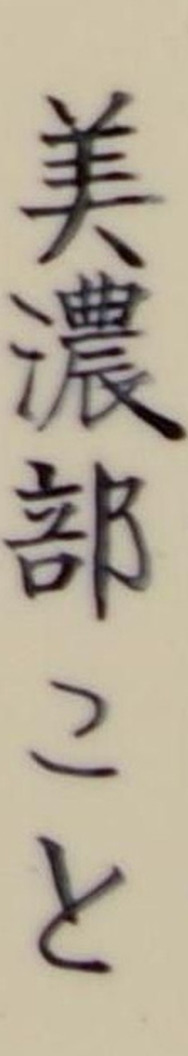美濃部こと
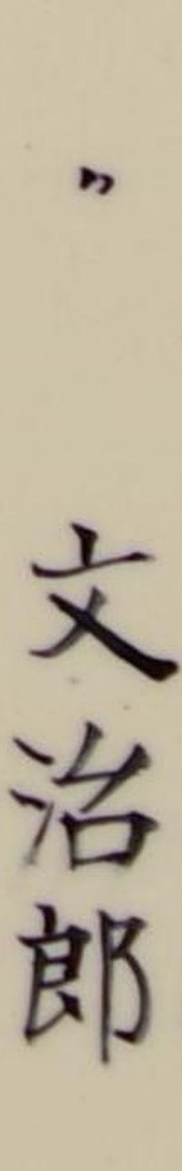文治郎
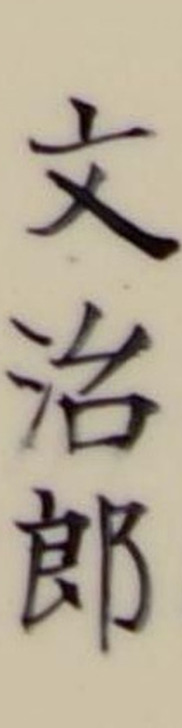文治郎
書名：E~L
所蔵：高野山金剛峯寺
